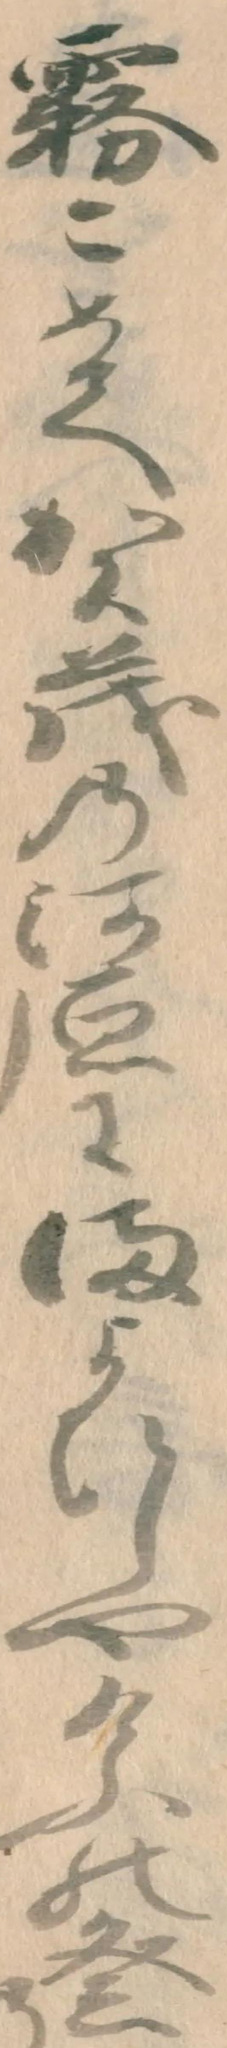霧こめて賀茂の河原にまよひしやけふの祭の
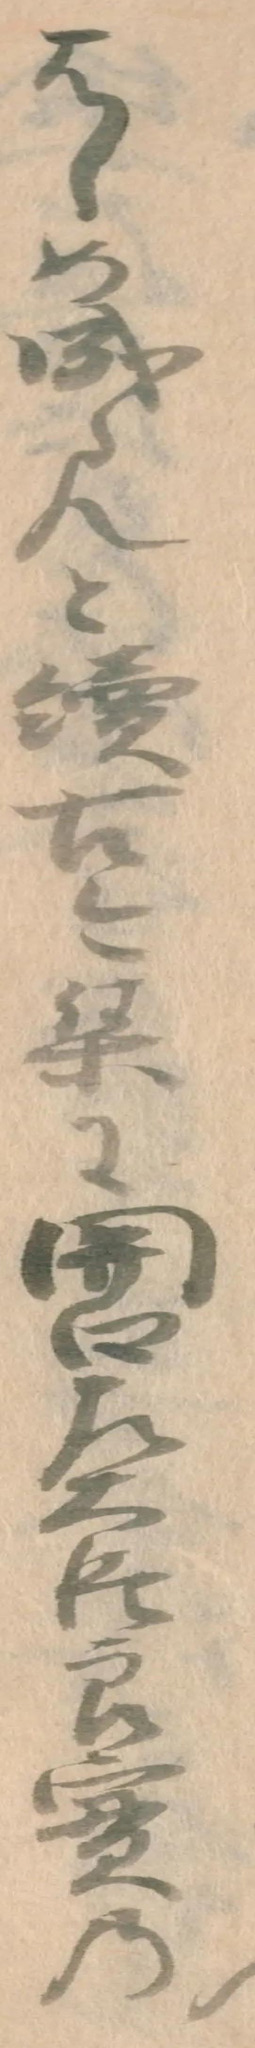はしめ成らんと続古今集に関白左大臣良実の
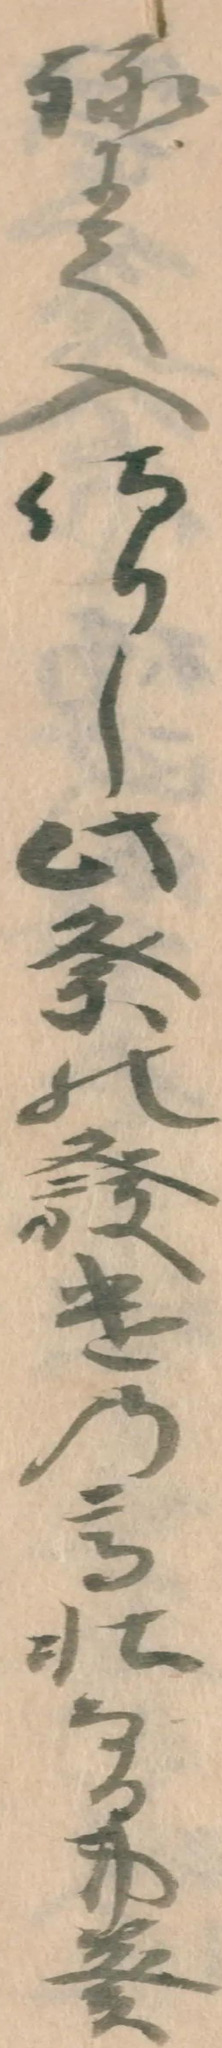詠にて入侍りし此祭の発遣の高壮なる事葵
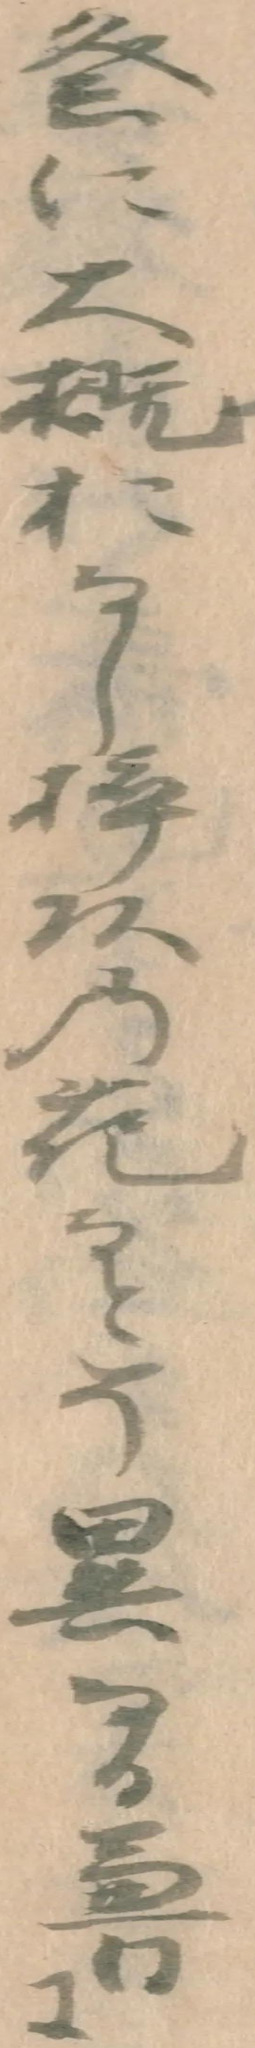祭に大概おなし挿頭の花なとそ異なる兼日に
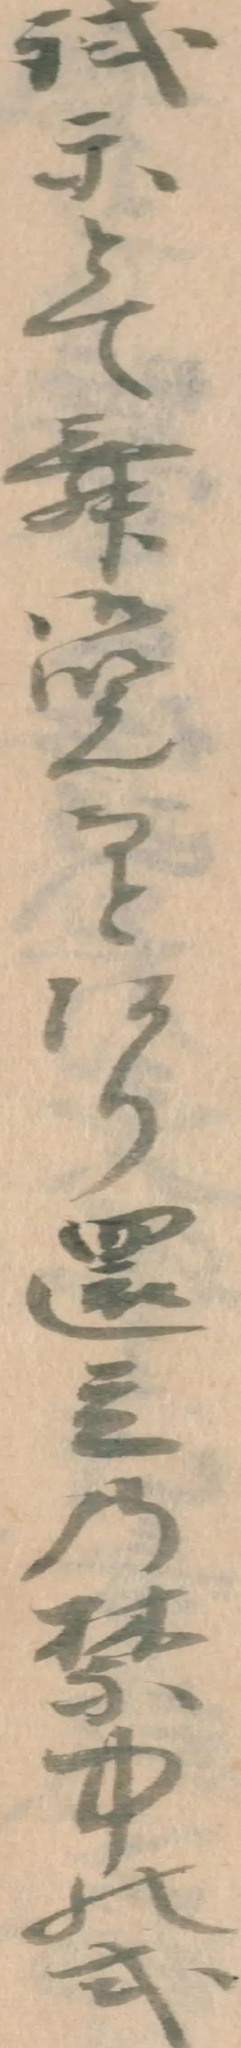試楽とて舞御覧なとあり還立の禁中の式
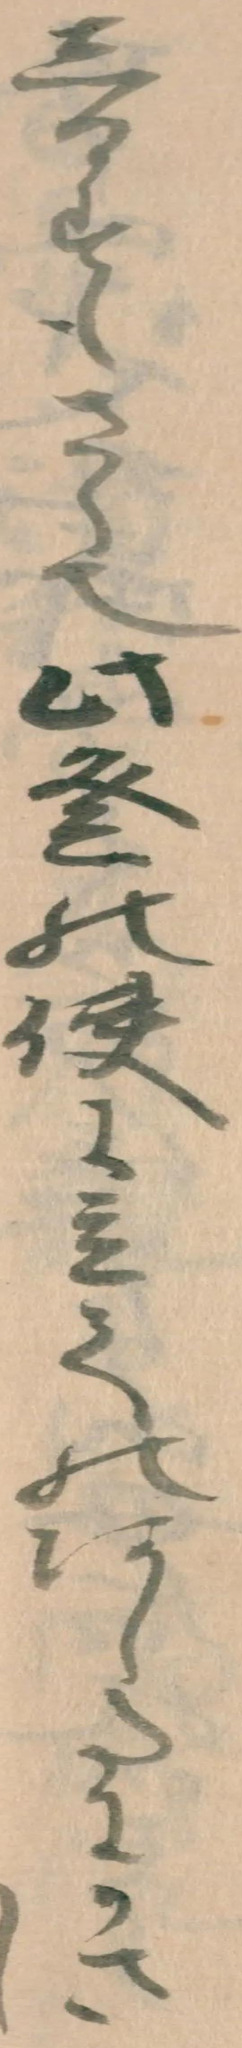しるすもさら也此祭の使に立てのあしたにかさし
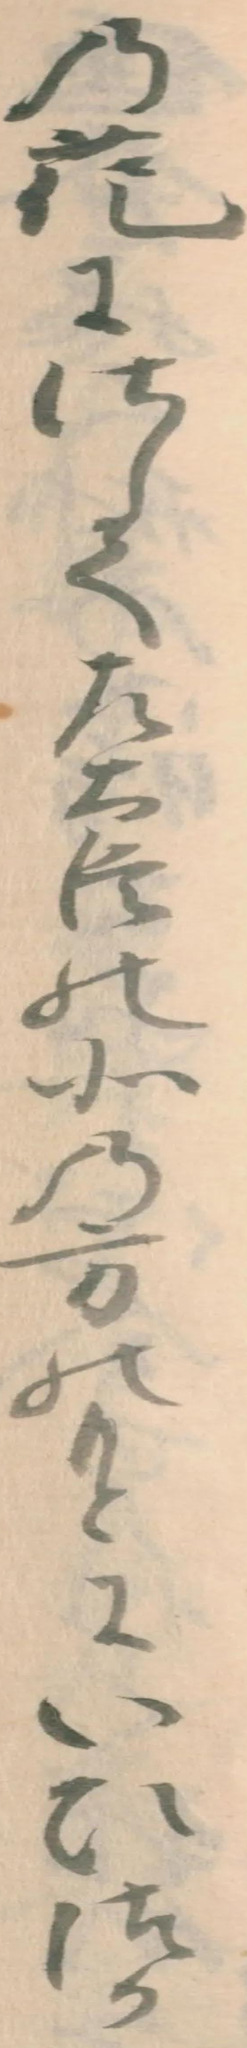の花にさして左大臣の北の方のもとにいひつか
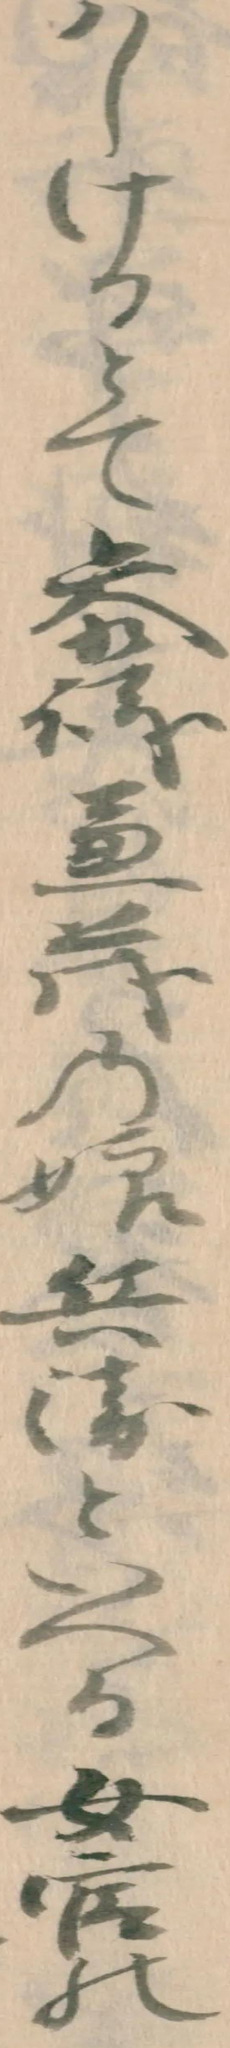はしけるとて参議兼茂の娘兵衛といへる女宮の哥に
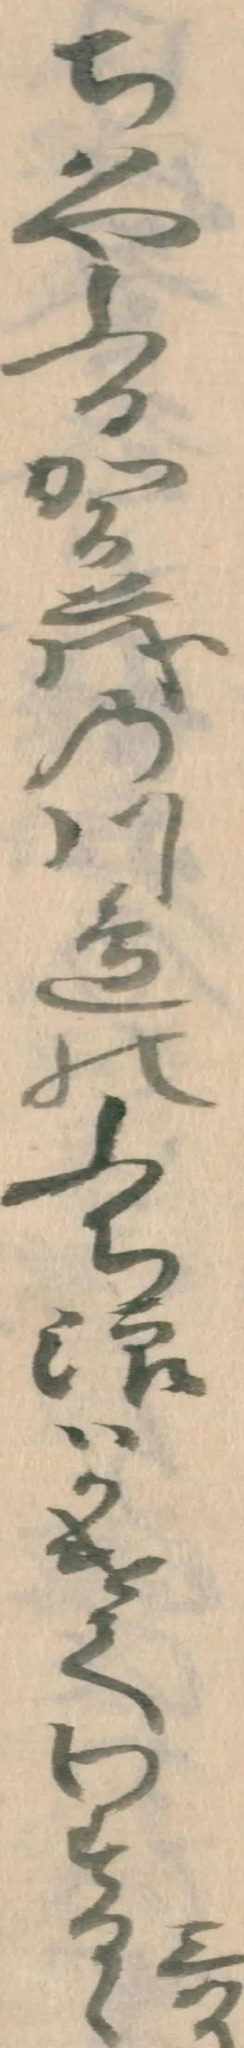ちはやふる賀茂の川辺のふち浪はかけてわするゝ
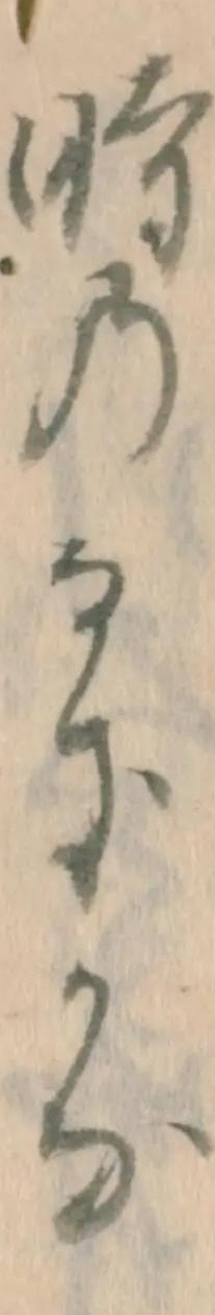時のなきかな
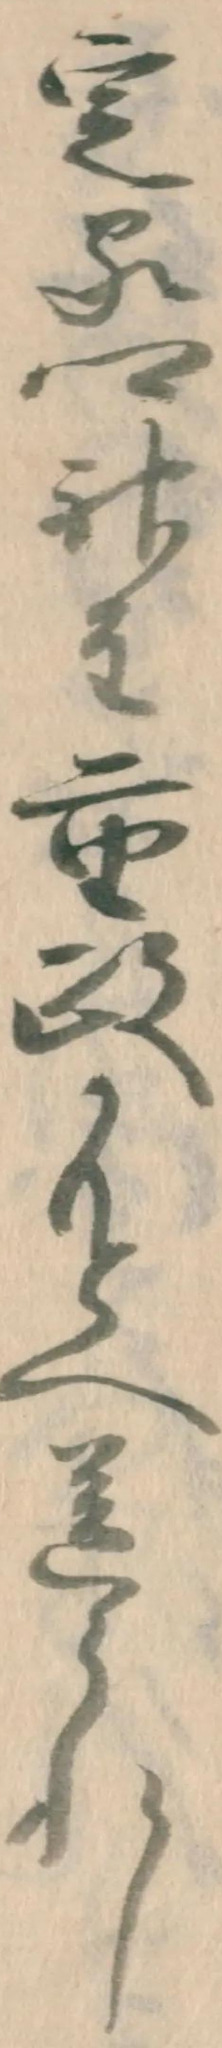定家卿神主重政かもとへ送られし
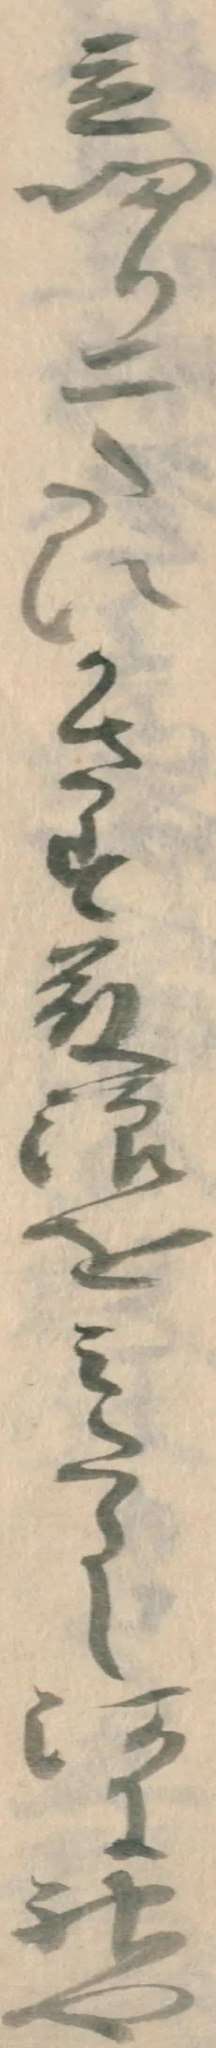立帰り二たひかさす藤浪をみたらし河に神や
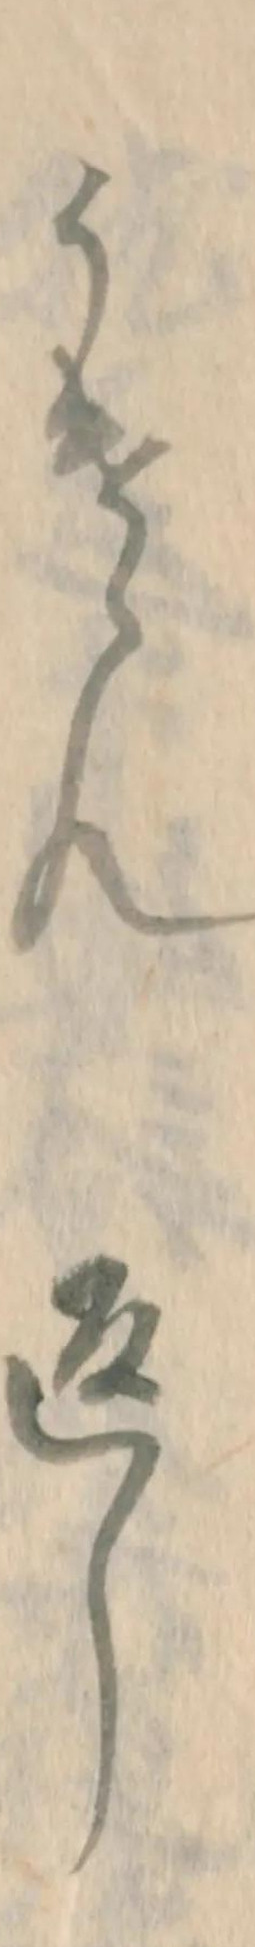うけゝん返し
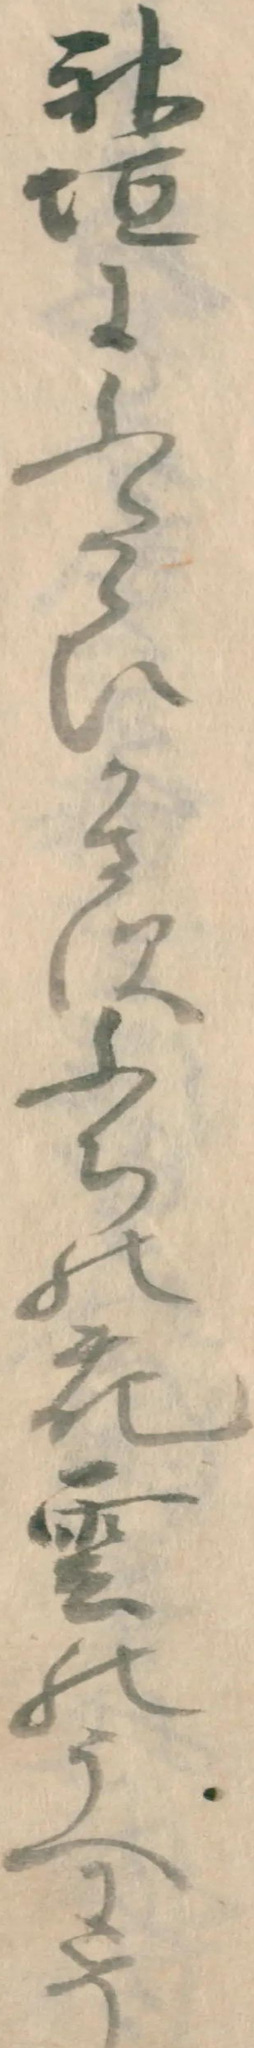神垣にふたゝひかさすふちの花雲のうへにそ
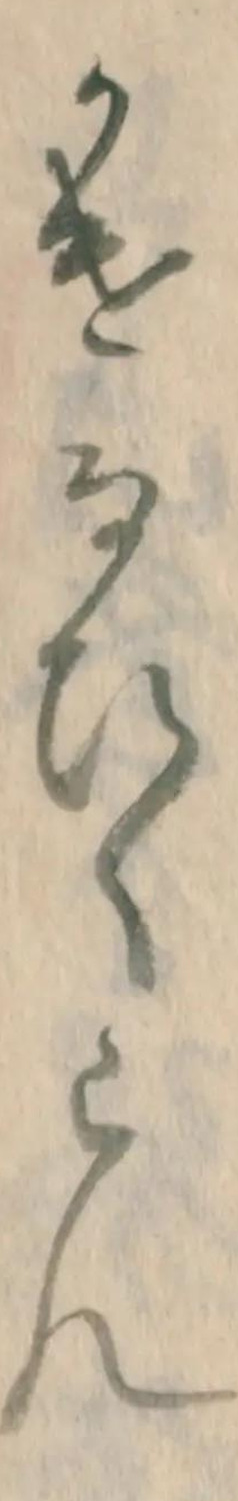かけなひくらん

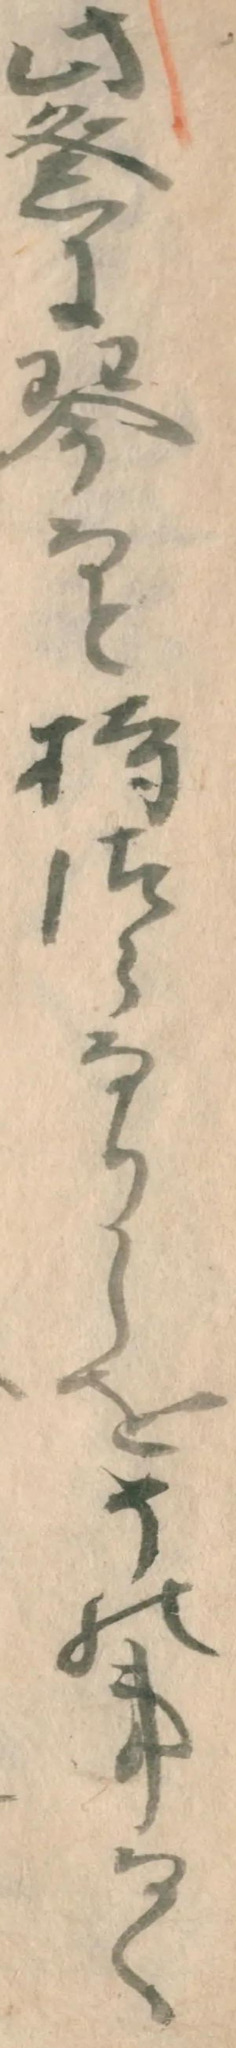此祭に琴なと持つらなりしをその事なく
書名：賀茂社記録. 第1冊
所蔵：国立国会図書館 National Diet Library, JAPAN
